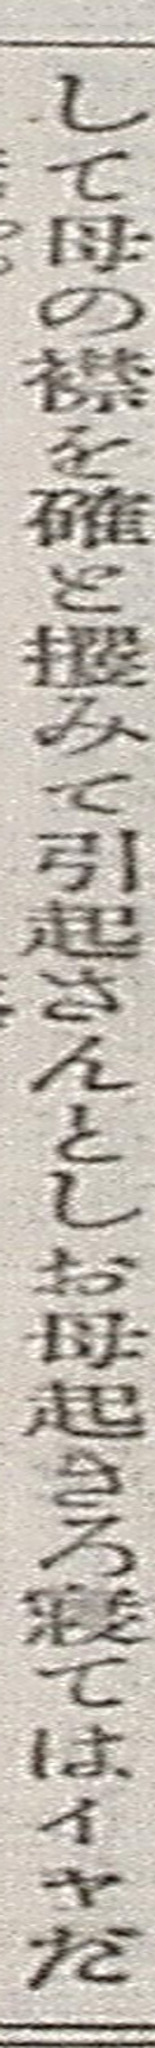して母の襟を確と攫みて引起さんとしお母起きろ寝てはイヤだ
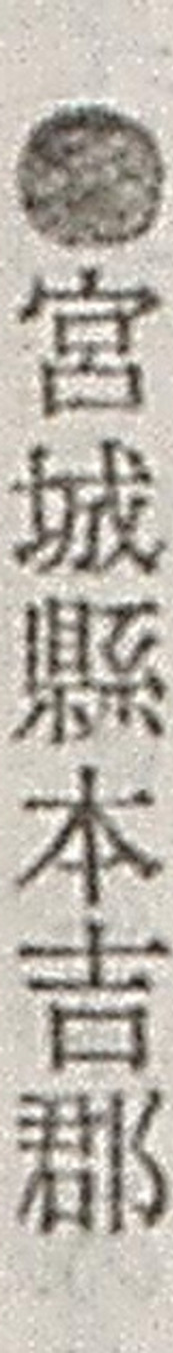●宮城県本吉郡
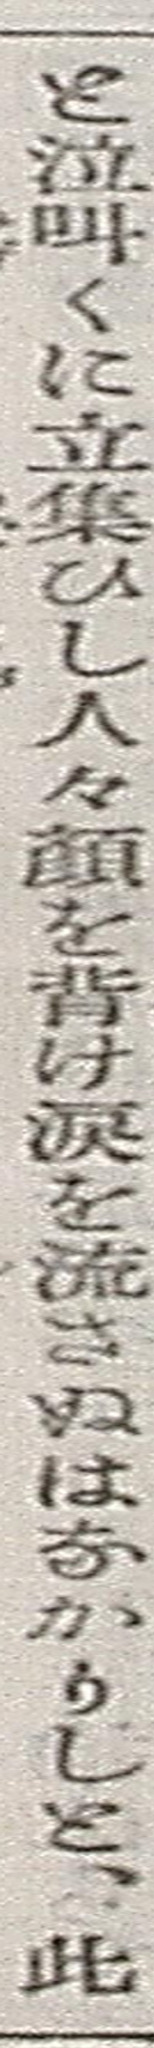と泣叫くに立集ひし人々顔を背け涙を流さぬはなかりしと、此
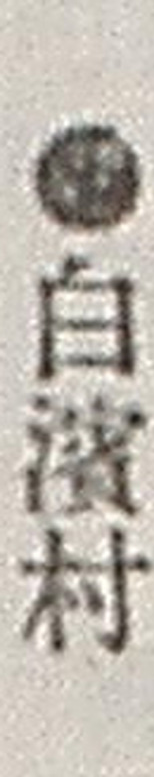●白浜村
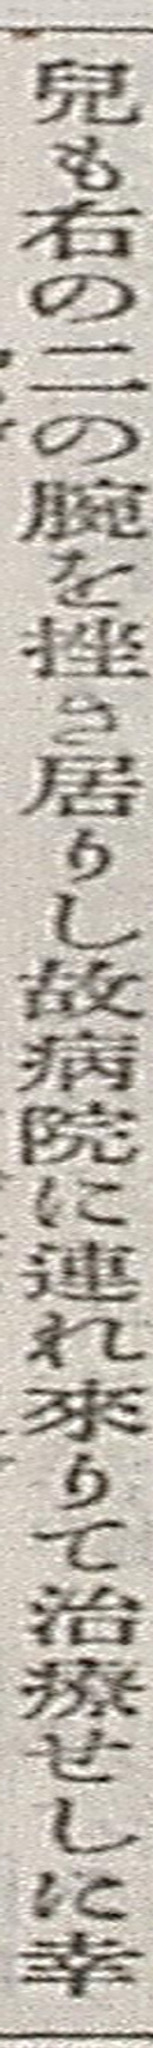兒も右の二の腕を挫き居りし故病院に連れ来りて治療せしに幸
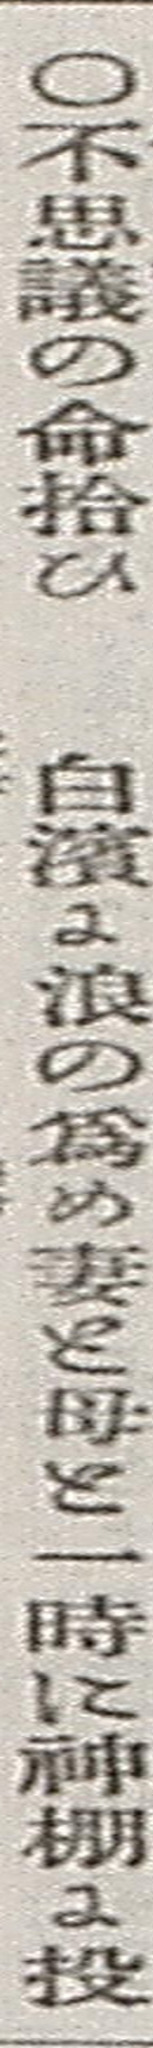○不思議の命拾い白浜に浪の為め妻と母と一時に神棚に投
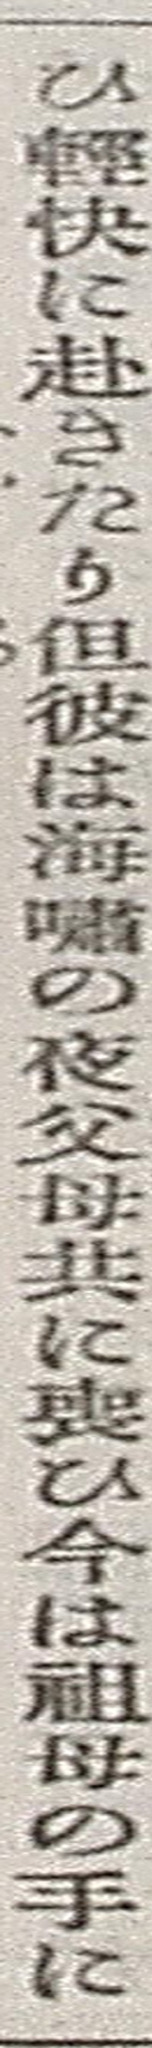ひ軽快に赴きたり但彼は海嘯の夜父母共に喪ひ今は祖母の手に
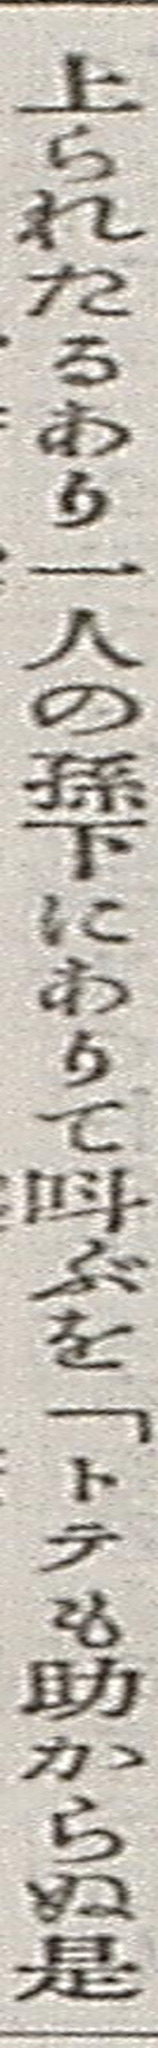上られたるあり一人の孫下にありて叫ぶを「トテも助からぬ是
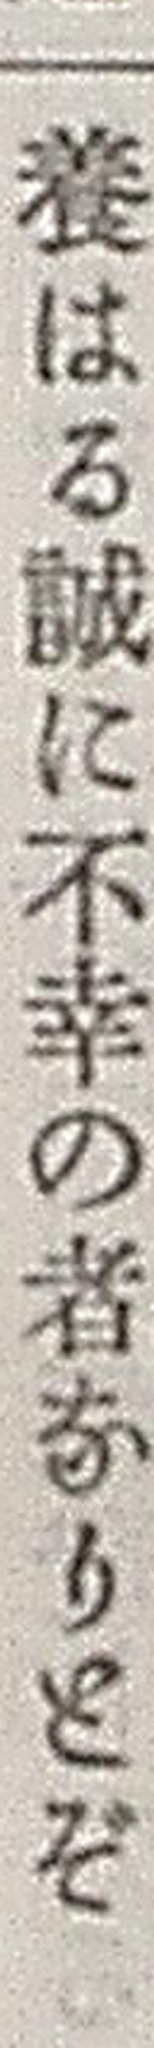養はる誠に不幸の者なりとぞ
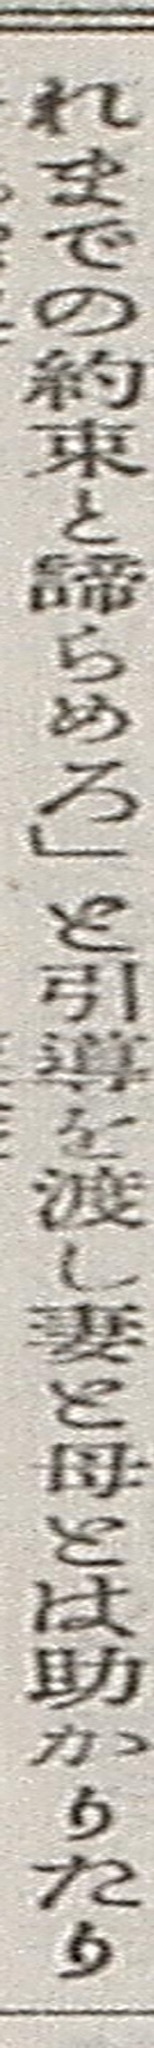れまでの約束と諦らめろ」と引導を渡し妻と母とは助かりたり
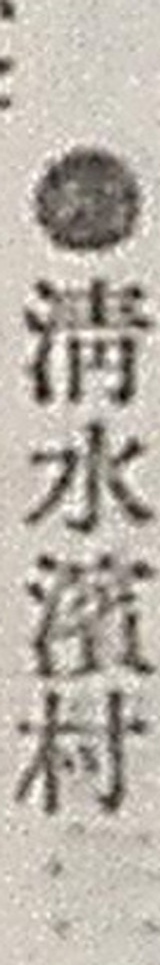●清水浜村
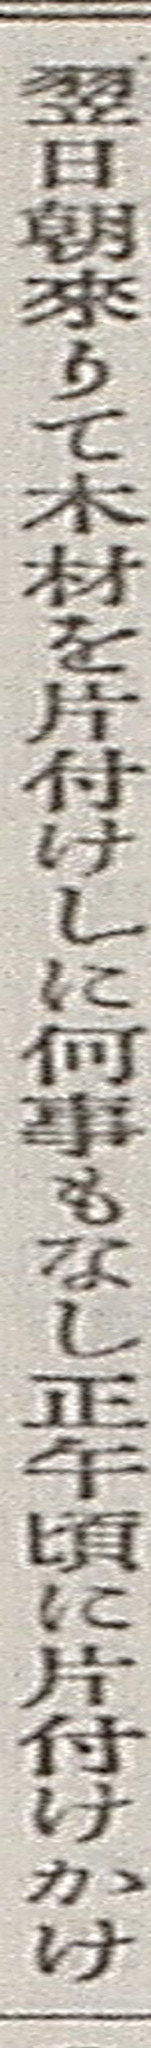翌日朝来りて木材を片付けしに何事もなし正午頃に片付けかけ
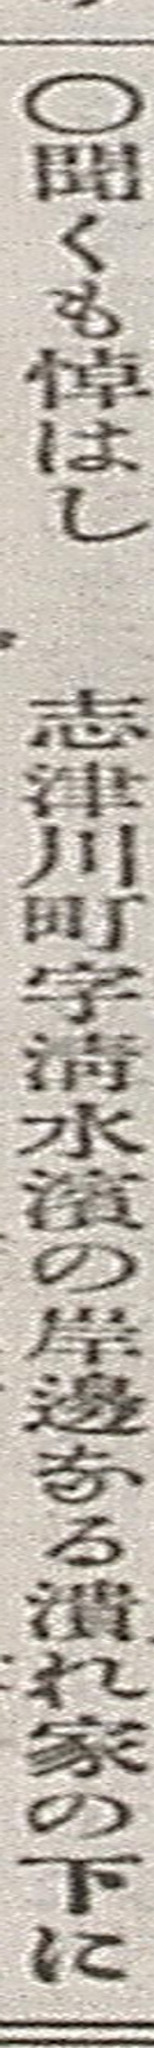○聞くも悼はし志津川町字清水浜の岸辺なる潰れ家の下に
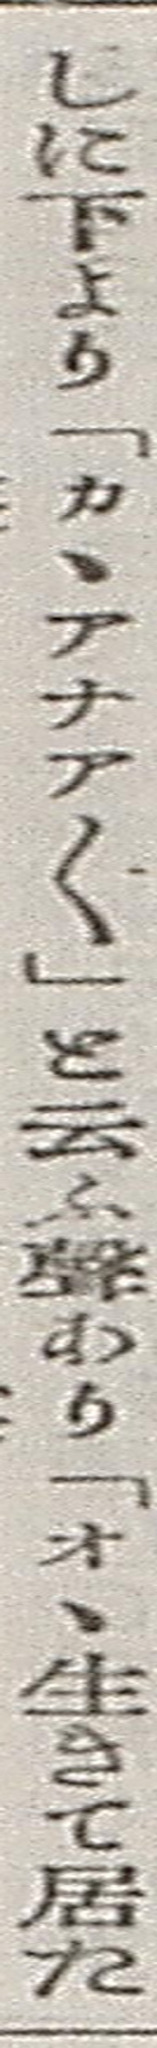しに下より「カヽアナア〳〵」と云ふ声あり「オヽ生きて居た
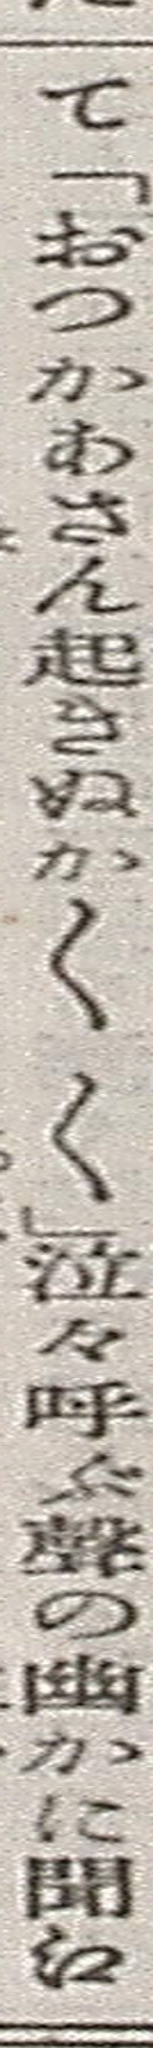て「おつかあさん起きぬか〳〵〳〵」泣々呼ぶ声の幽かに聞え
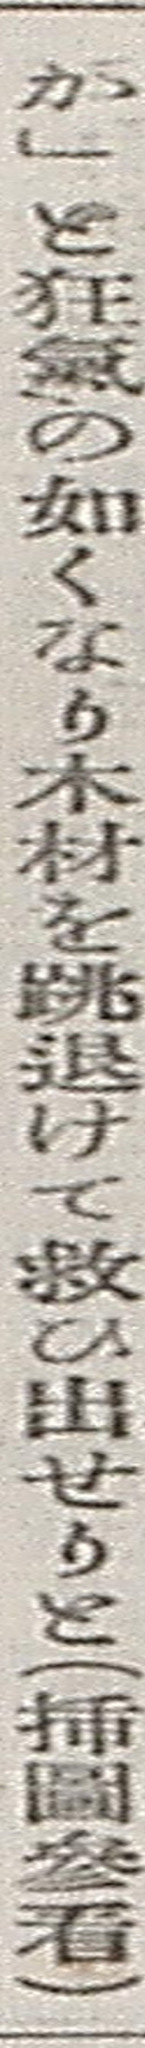か」と狂気の如くなり木材を跳退けて救ひ出せりと
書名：風俗畫報臨時増刊第百二十號　大海嘯被害録（下）
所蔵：東京大学地震研究所図書室 Earthquake Research Institute Library, The University of Tokyo, JAPAN
